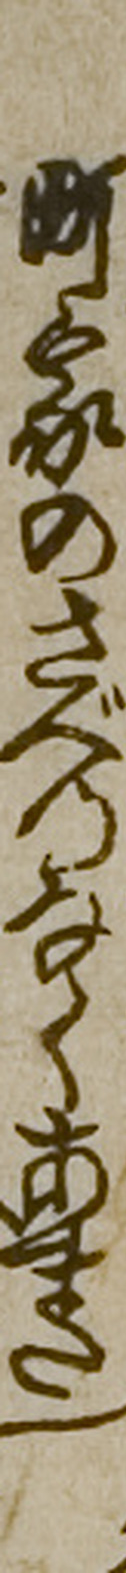町家のさべつなくあまた
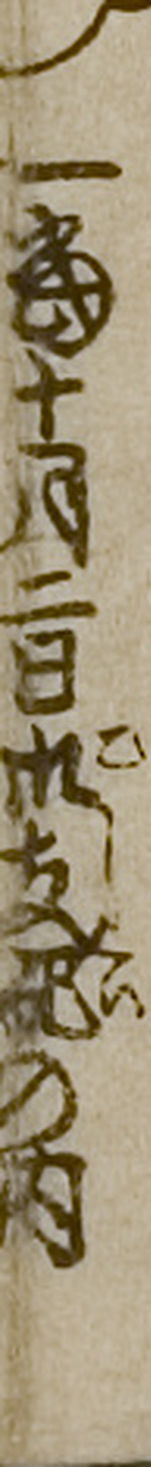一当十月二日御支配の内
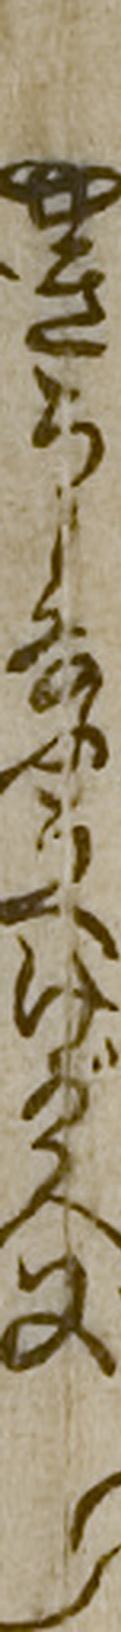やきうしなふうへけが人又
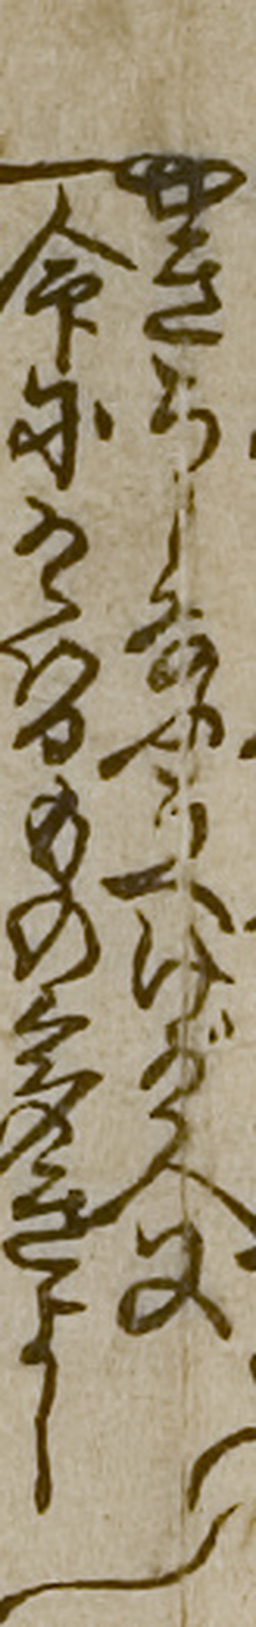一命にかゝはるもの多きよし
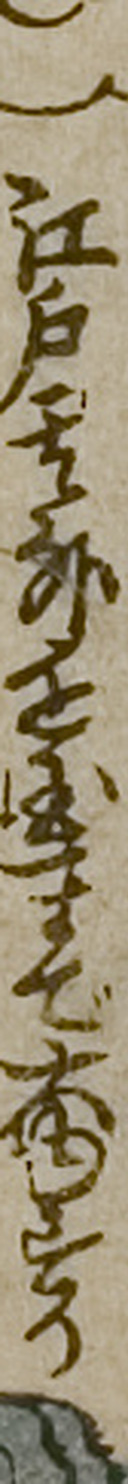江戸其外近国まで大ゆすり
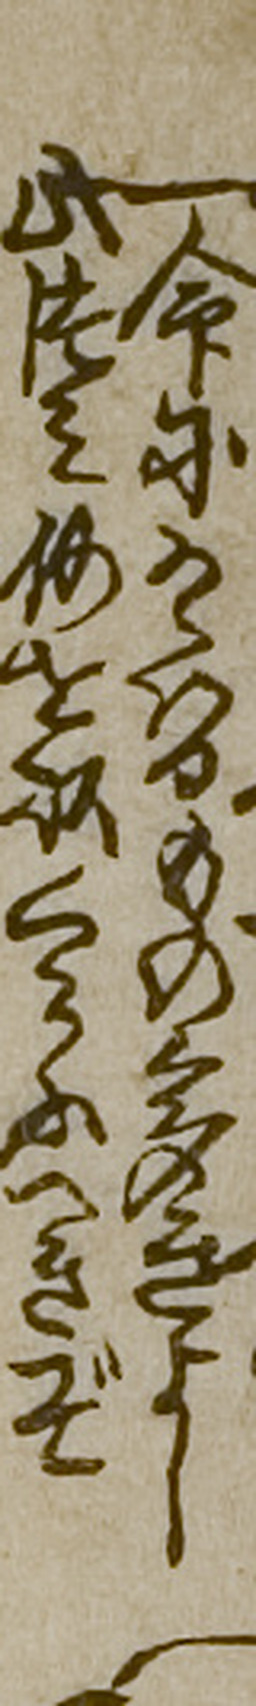此つみ何を以くらふへきぞ
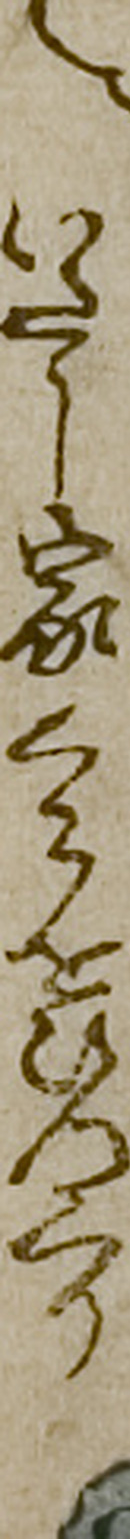いたし家くらをひつくり
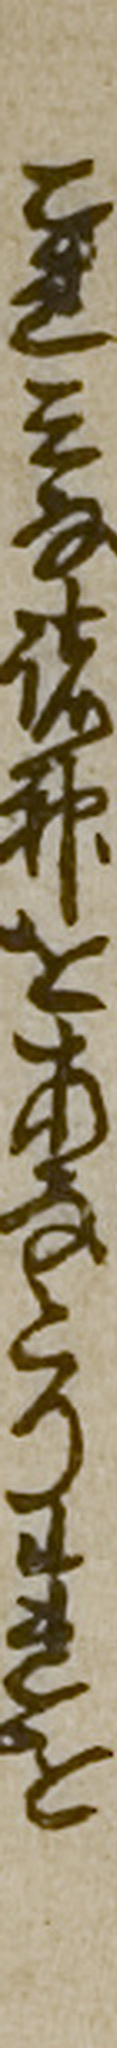これみな諸神をあなどりわれを
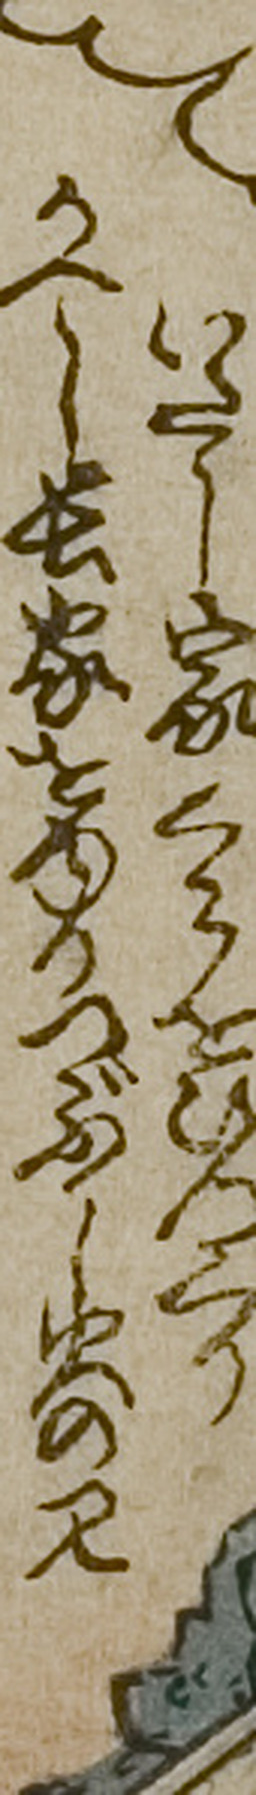かへし長家をゆりつぶし火の見
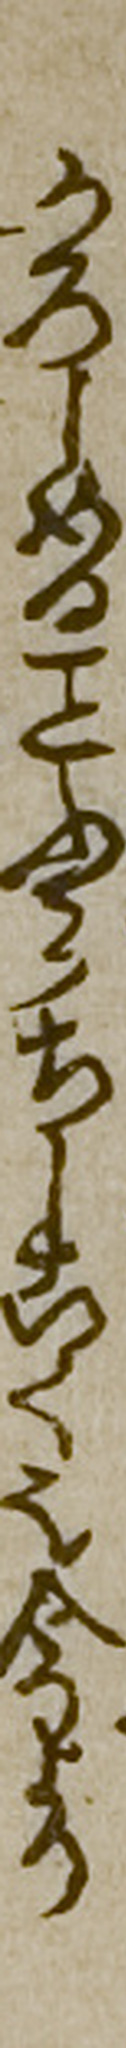かろしめることふらちしこく也今より
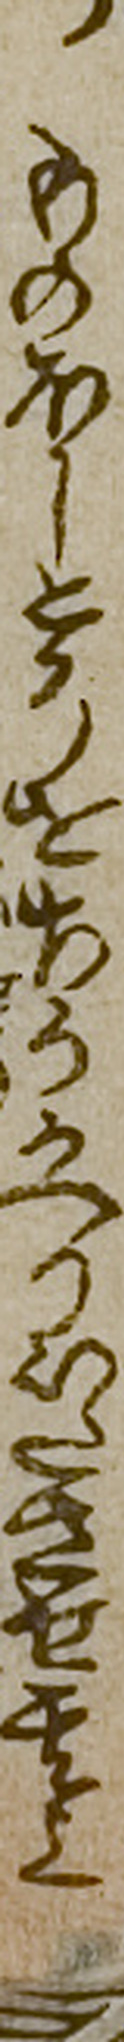ものほしとうをちうかへりいたさせ其上
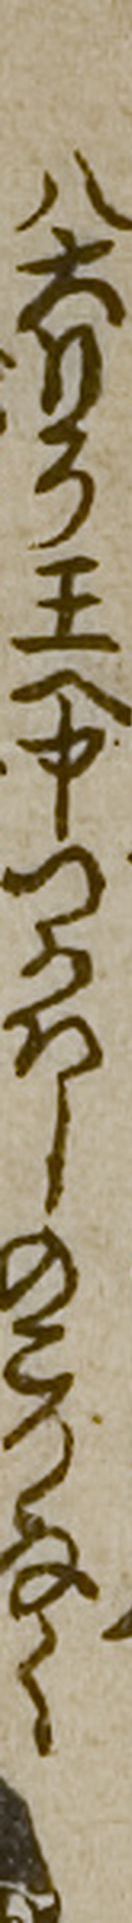八大りう王へ申つかはしのこりなく
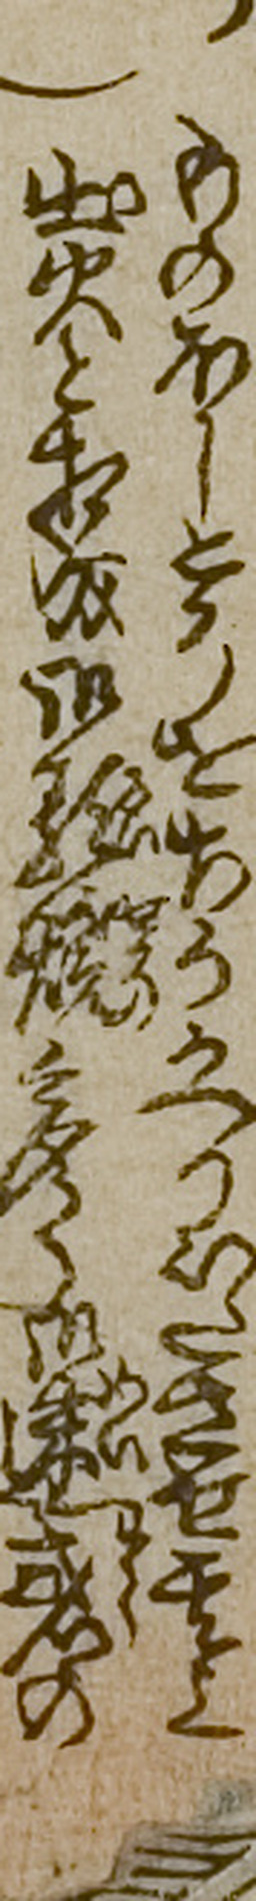出火と相成御類焼多く御迷惑の
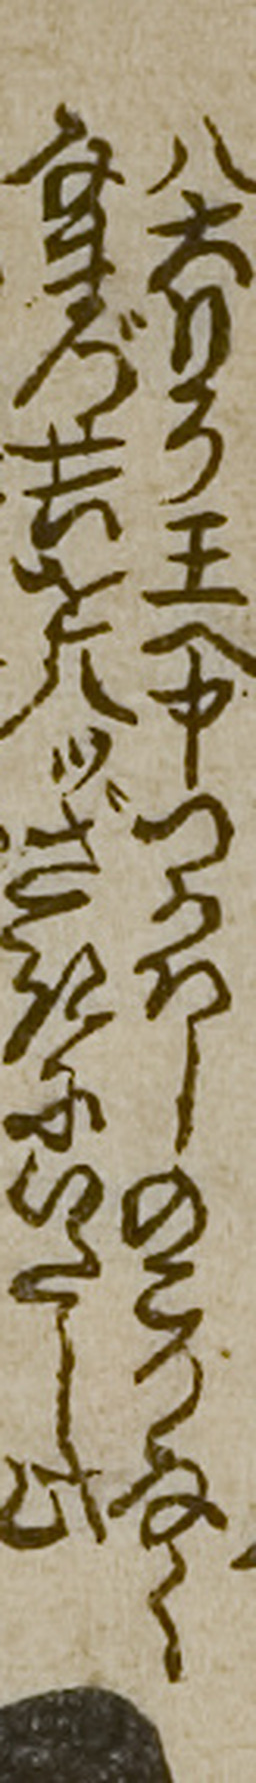なまづ共を八つざきにいたし此
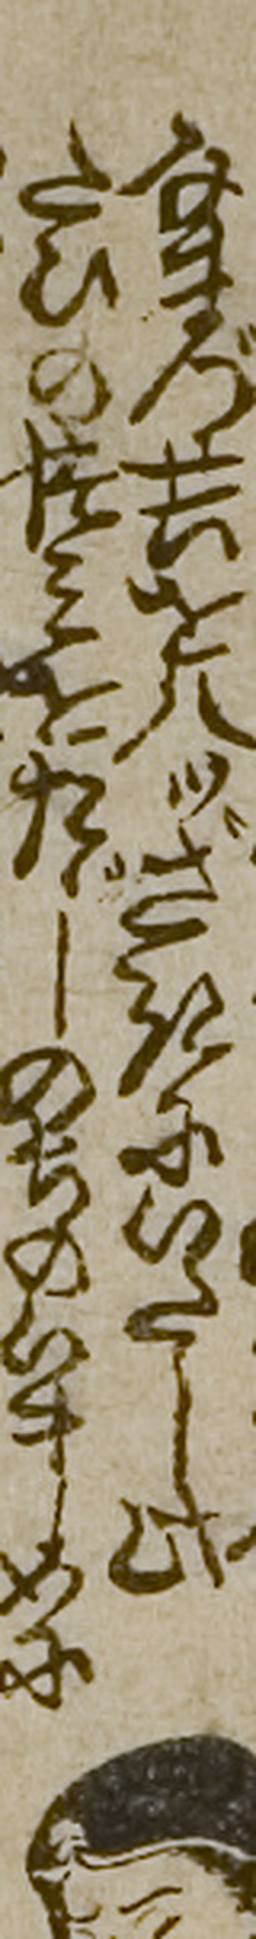たひのつみをたゞしのちのいましめに
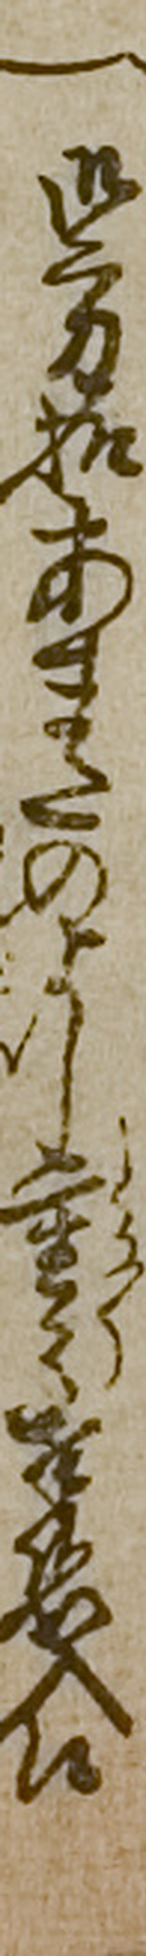御方様あまたのよし重々奉恐入候
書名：鹿島大神宮託曰
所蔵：東京大学総合図書館 General Library in the University of Tokyo, JAPAN
